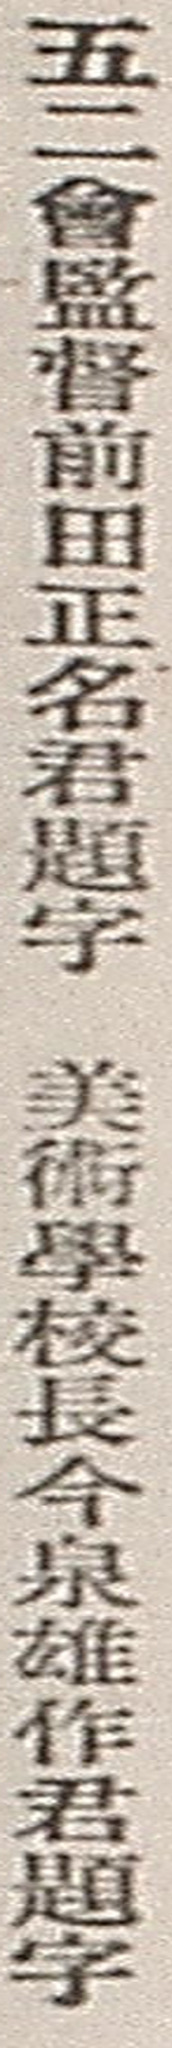五二会監督前田正名君題字美術学校長今泉雄作君題字
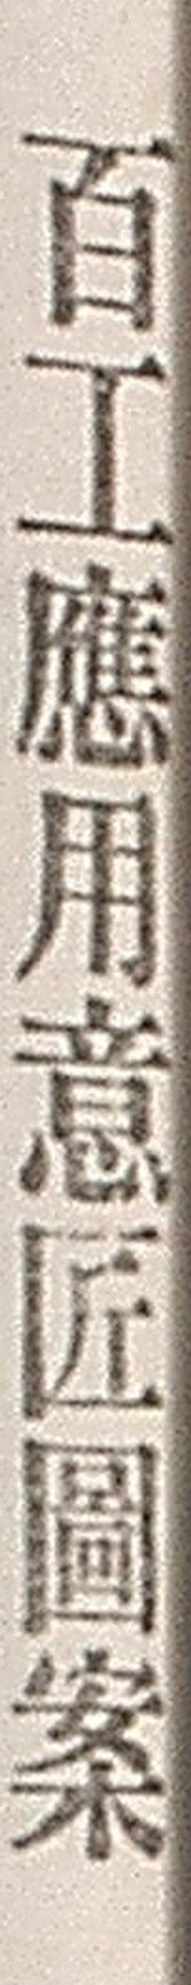百工応用意匠圖案
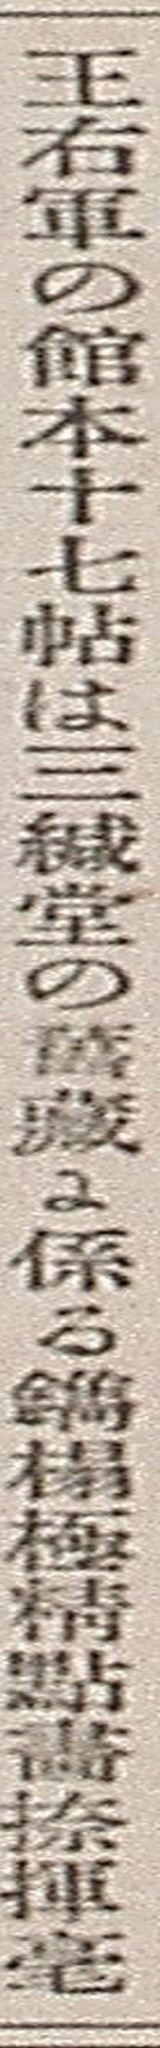王右軍の館本十七帖は三緘堂の舊蔵に係る鐫榻極精点畫捺揮毫
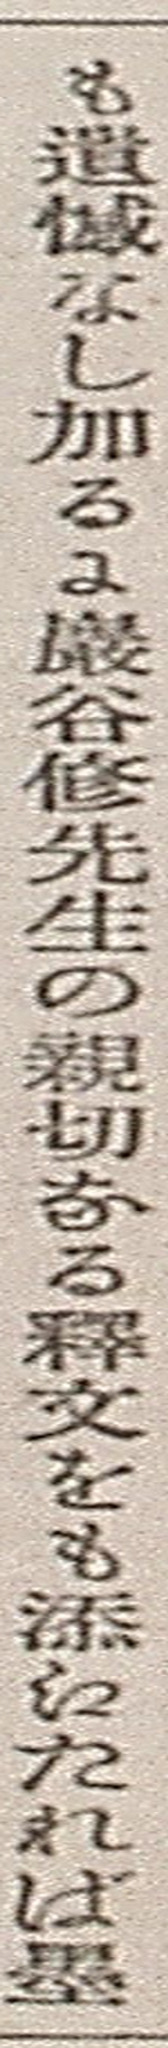も遺憾なし加るに巌谷修先生の親切なる釈文をも添江たれば墨
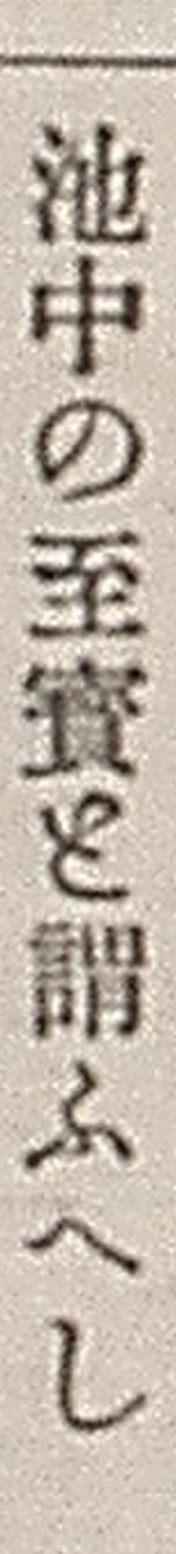池中の至宝と謂ふべし
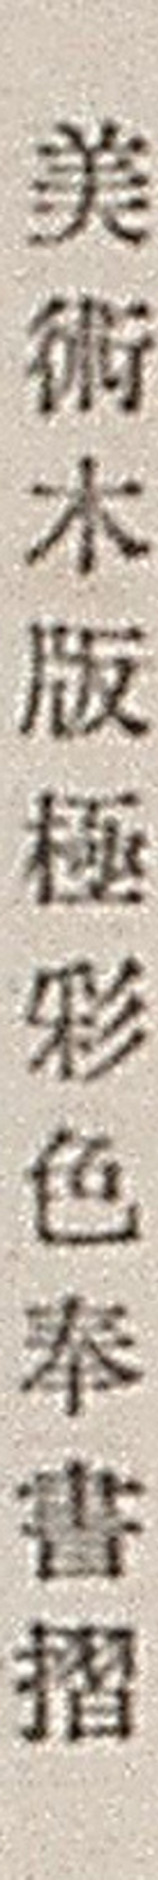美術木版極彩色奉書摺
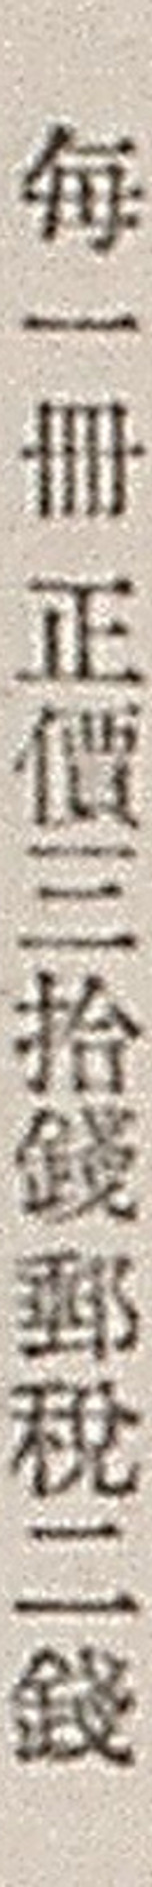毎一冊正価三拾銭郵税二銭
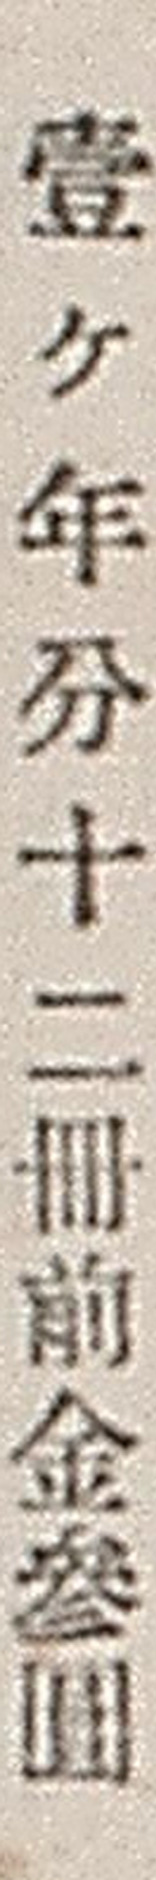壱ヶ年分十二冊前金参圓
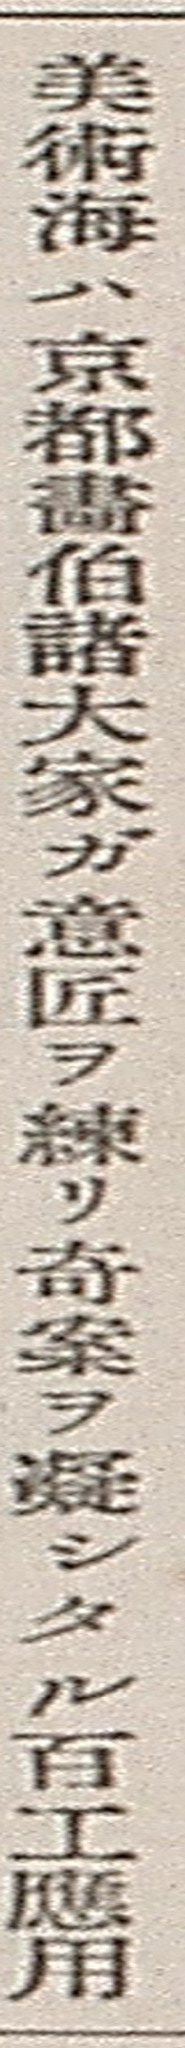美術海ハ京都畫伯諸大家ガ意匠ヲ練リ奇案ヲ凝シタル百工応用
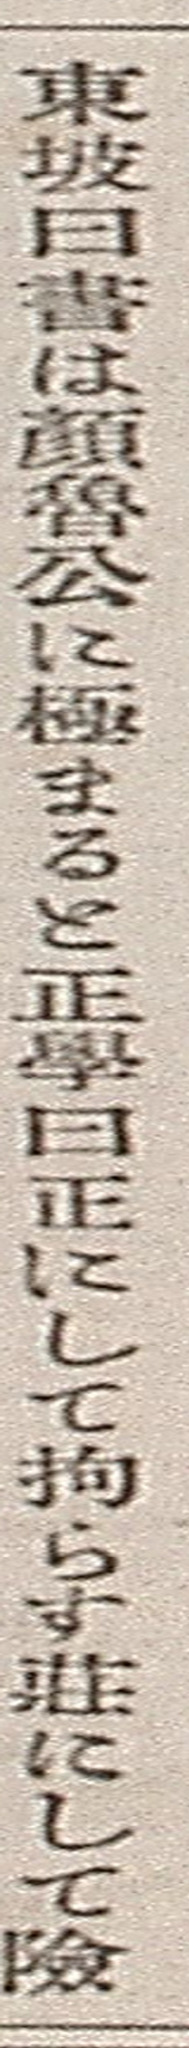東坡曰書は顔魯公に極まると正学曰正にして拘らず荘にして険
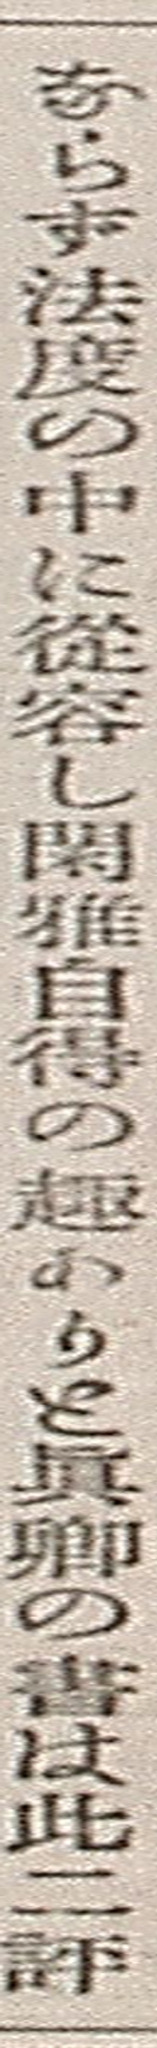ならず法度の中に従容し閑雅自得の趣ありと真卿の書は此二評
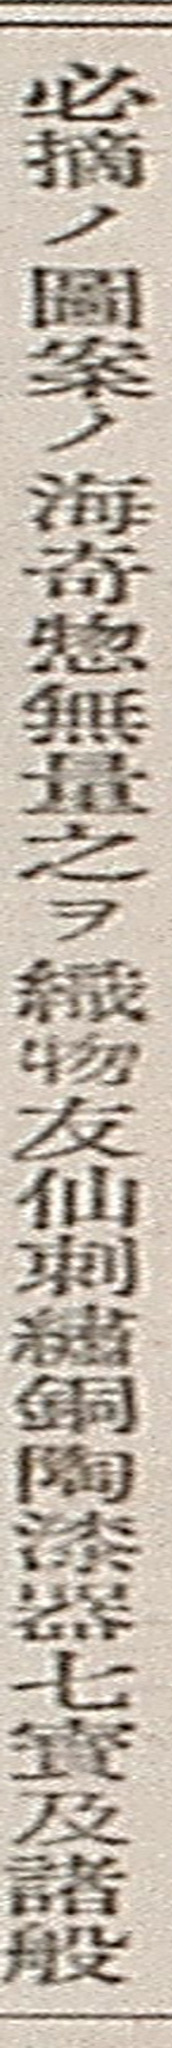必摘ノ圖案ノ海奇惣無量之ヲ織物友仙刺繍銅陶漆器七宝及諸般
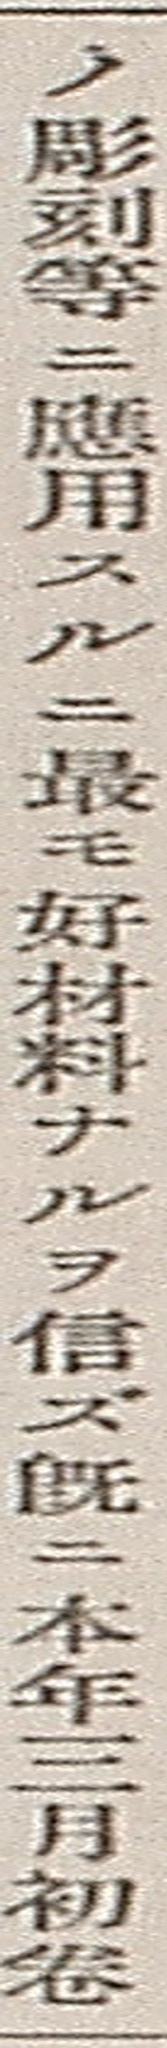ノ彫刻等二応用スル二最モ好材料ナルヲ信ズ既二本年三月初巻
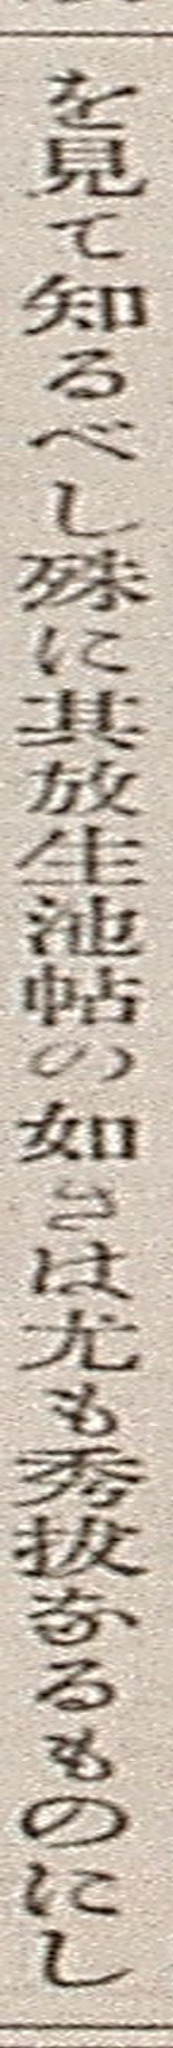を見て知るべし殊に其放生池帖の如きは尤も秀拔なるものにし
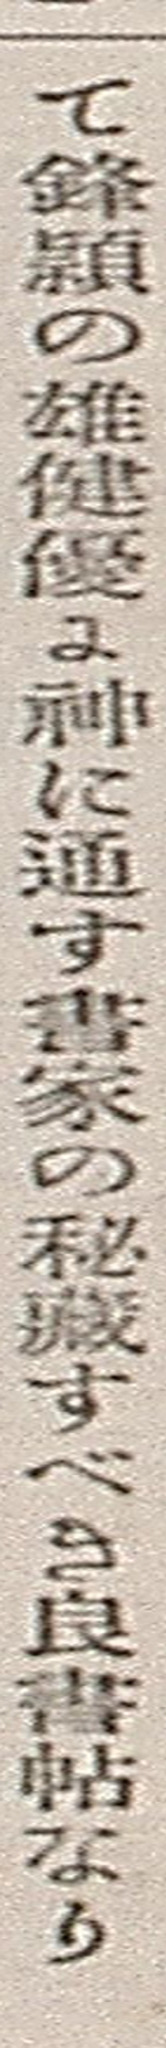て鋒頴の雄健優に神に通す書家の秘蔵すべき良書帖なり
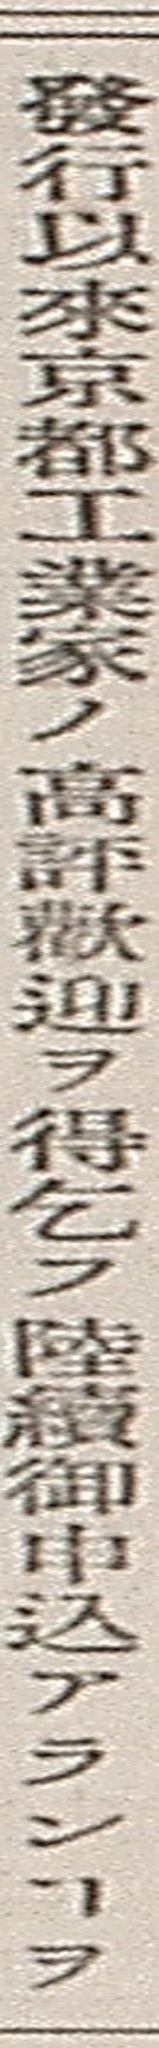発行以来京都工芸家の高評歓迎ヲ得乞ヲ陸続御申込アラン事ヲ
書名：風俗畫報臨時増刊第百二十六號　洪水被害録（中）
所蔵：東京大学地震研究所図書室 Earthquake Research Institute Library, The University of Tokyo, JAPAN
